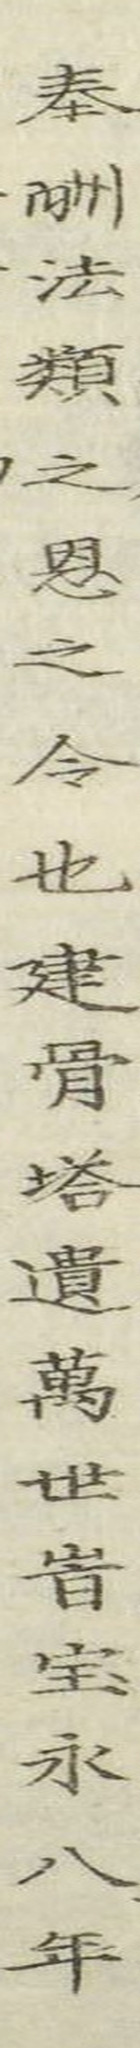奉酬法類之恩之令也建骨塔遺萬世旹宝永八年
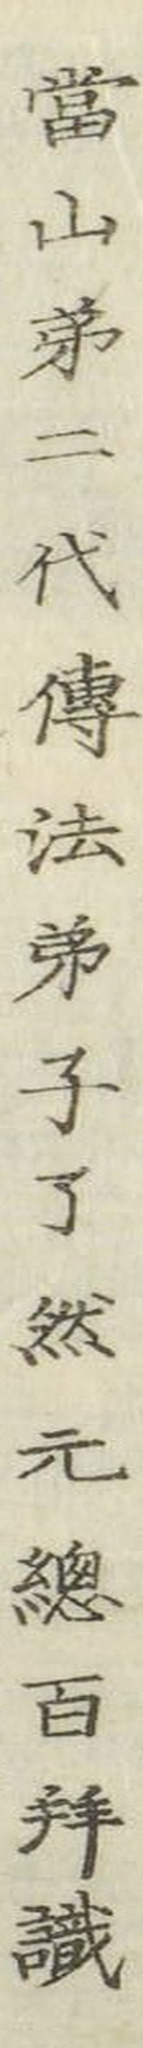當山弟二代傳法弟子了然元緫百拜識
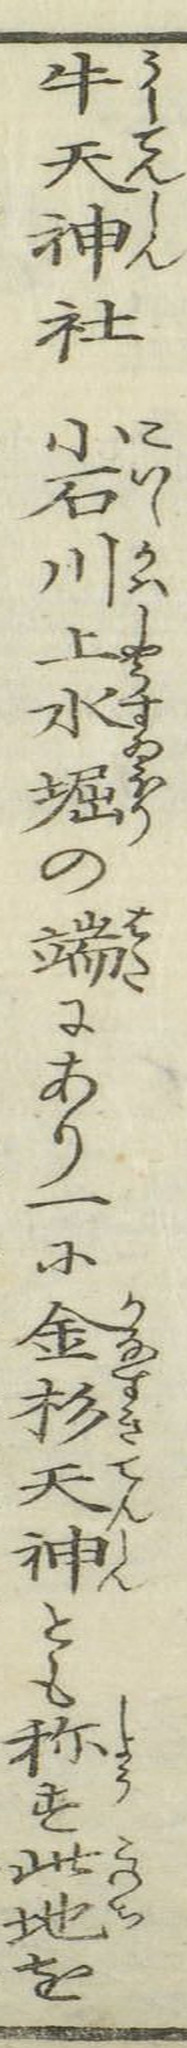牛天神社小石川上水堀の端にあり一に金杉天神とも称す此地を

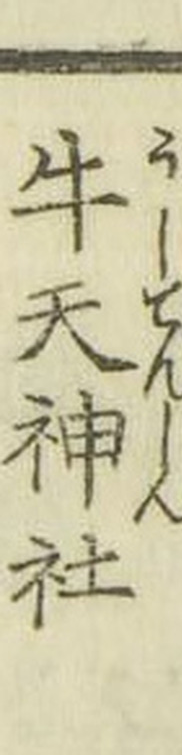牛天神社
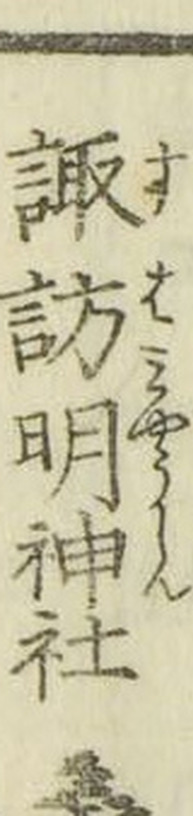諏訪明神社

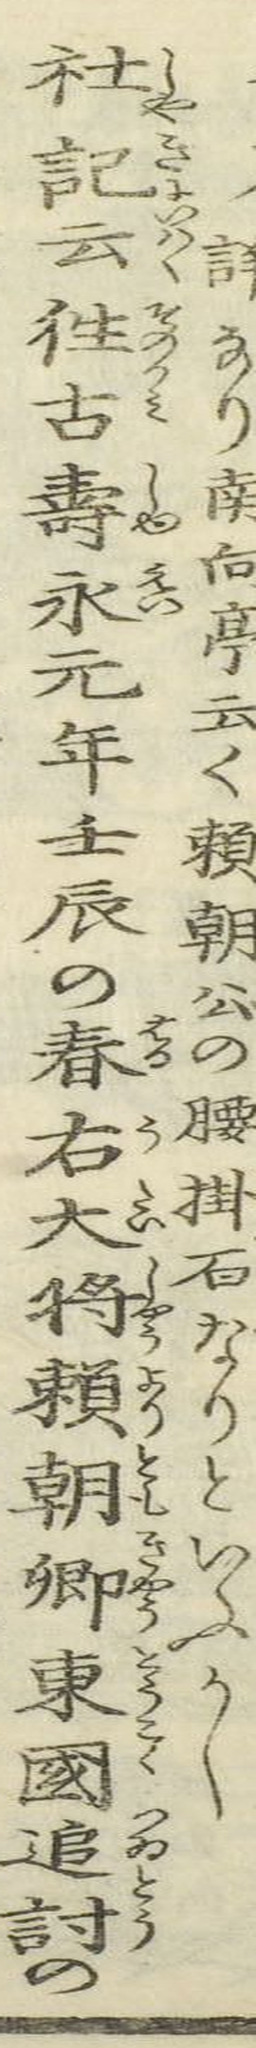社記云往古壽永元年壬辰の春右大將頼朝卿東國追討の
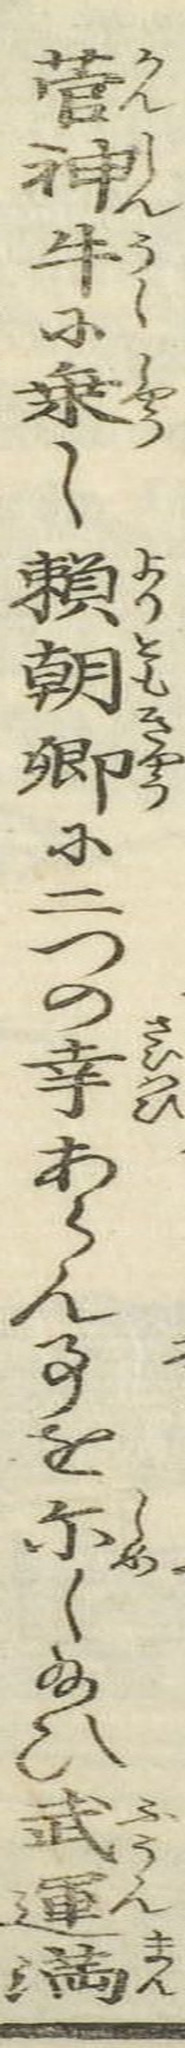菅神牛に乗し頼朝卿に二つの幸あらん事を尓し給ひ武運満
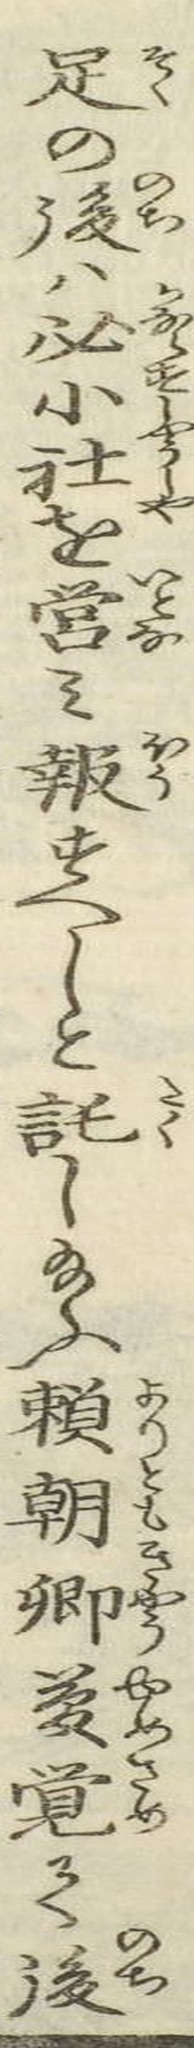足の後は必小社を営み報すへしと託し給ふ頼朝卿夢覚て後
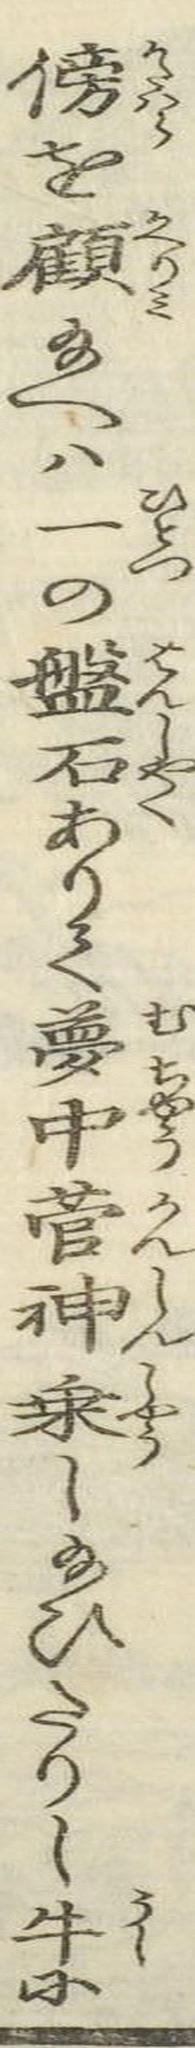傍を顧給へは一の盤石ありて夢中菅神乗し給ひたりし牛に
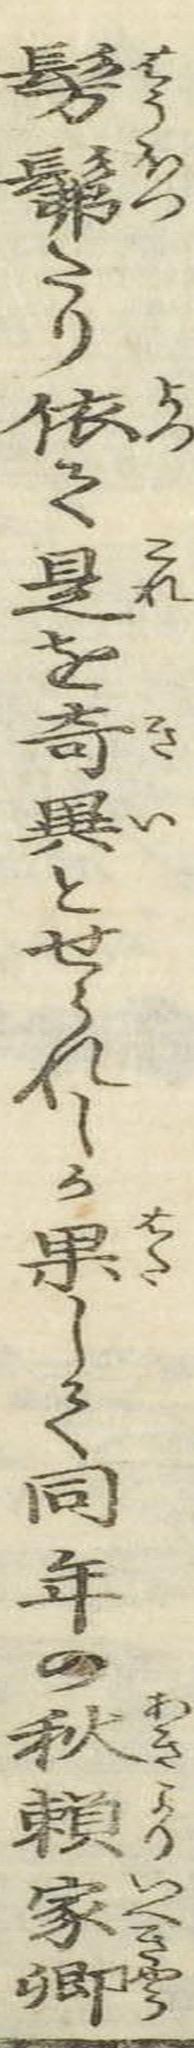髣髴たり依て是を奇異とせられしか果して同年の秋頼家卿
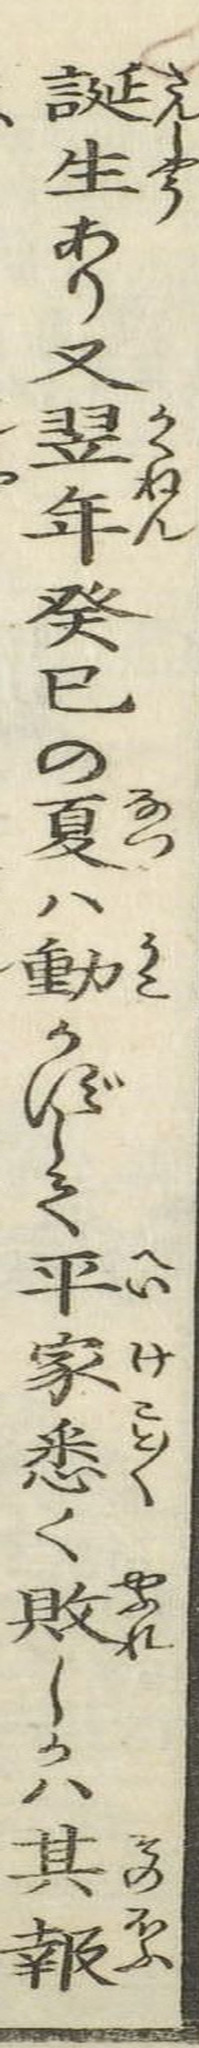誕生あり又翌年癸巳の夏は動かずして平家悉く敗しかは其報
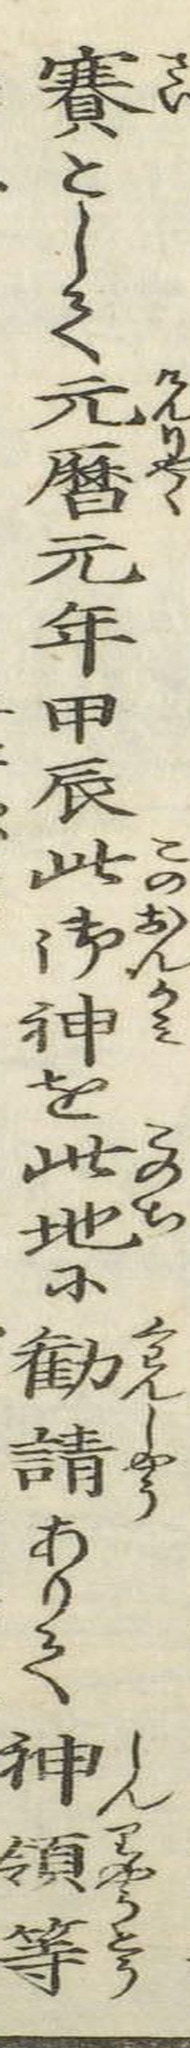賽として元暦元年甲辰此御神を此地に勧請ありて神領等
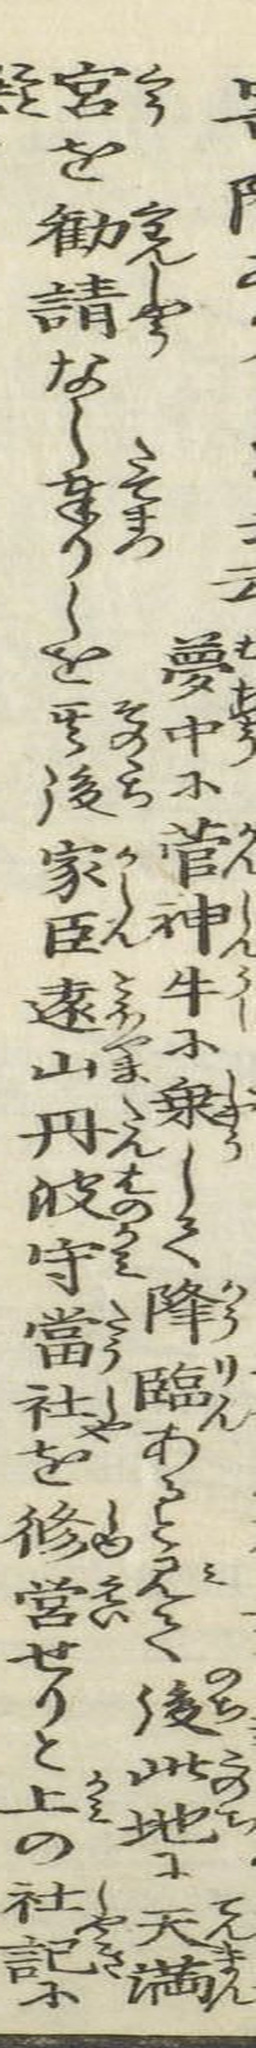宮を勧請なし奉りしを其後家臣遠山丹波守當社を修営せりと上の社記に異なり
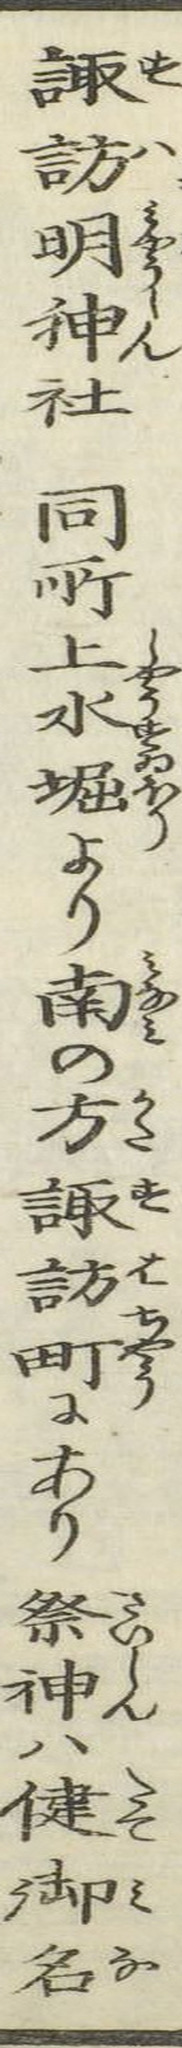諏訪明神社同所上水堀より南の方諏訪町にあり祭神は健御名
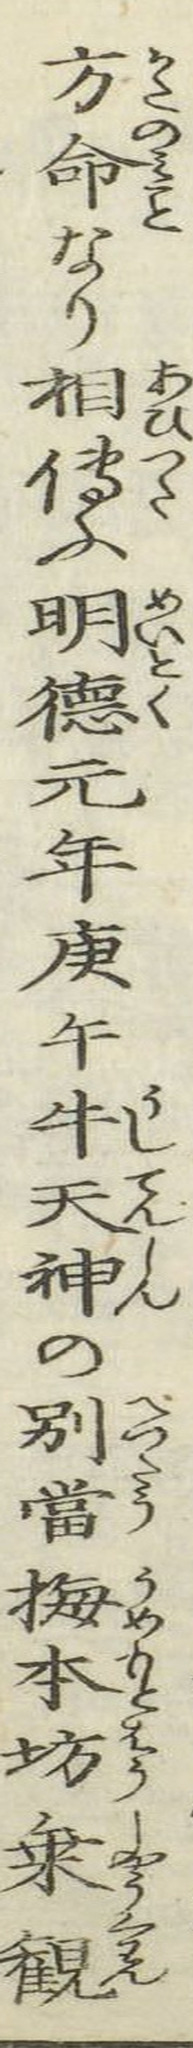方命なり相傳ふ明德元年庚午牛天神の別當梅本坊乗観
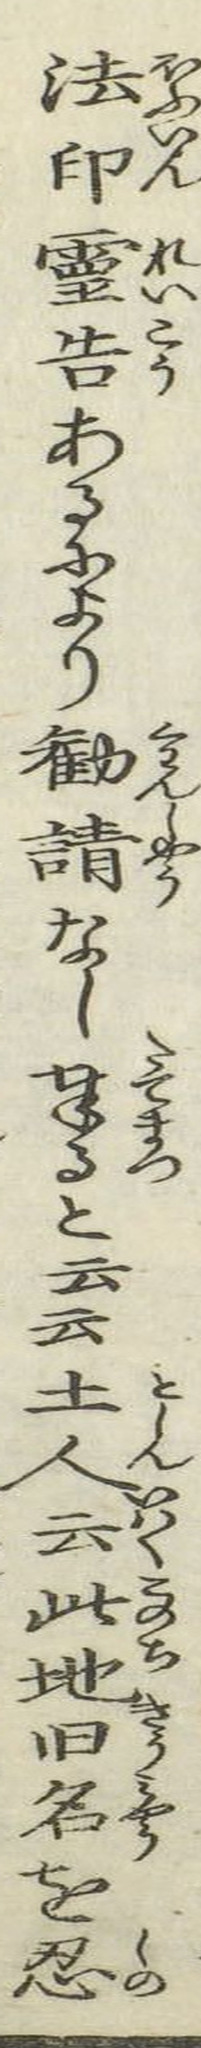法印靈告あるにより勧請なし奉ると云云土人云此地旧名を忍
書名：江戸名所図会 20巻 巻之12
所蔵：東京学芸大学教育コンテンツアーカイブ
